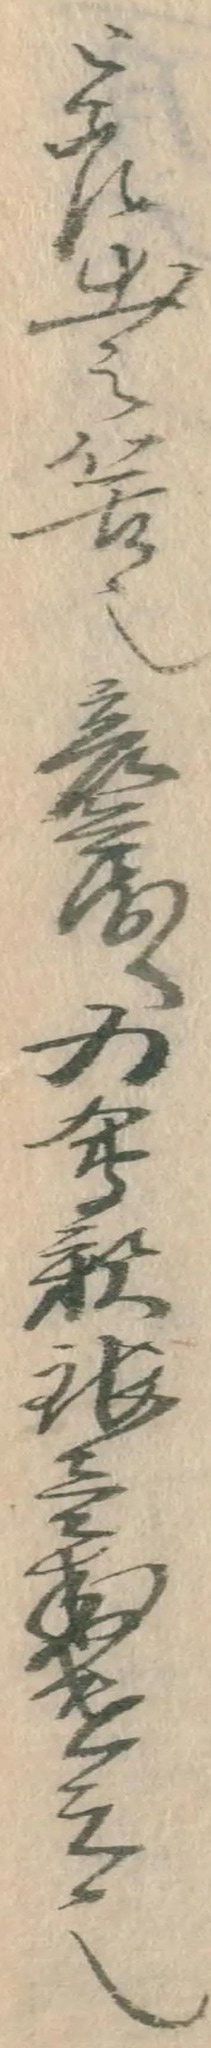被差出之筈也彦兵衛へ為會釈銀壱封遣之也

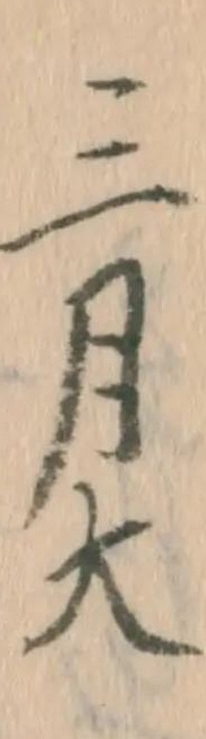三月大
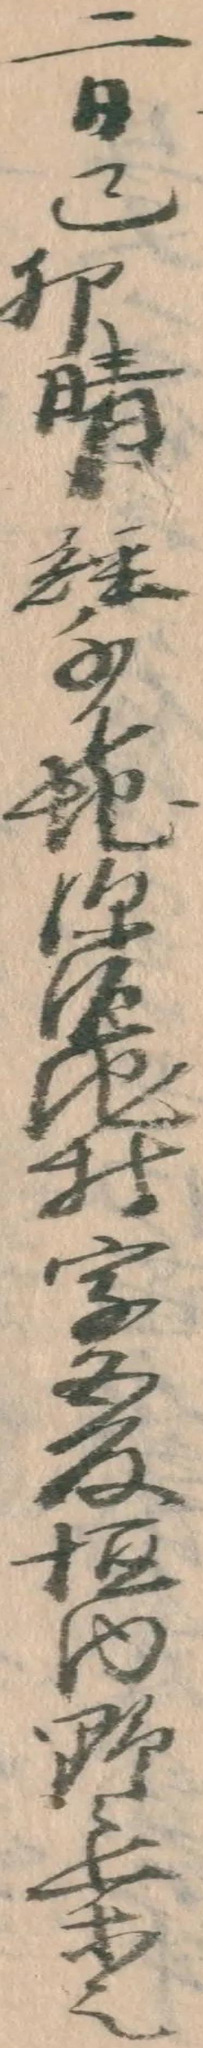二日己卯晴経千下地深沼池村字五反恒内野々上等之
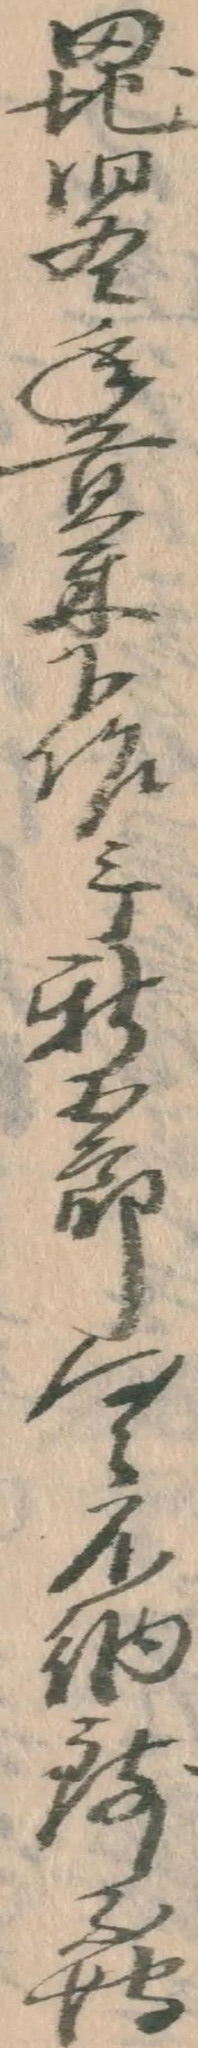田地旧冬年貢米下作三ノ新五郎向々不納致し不埒
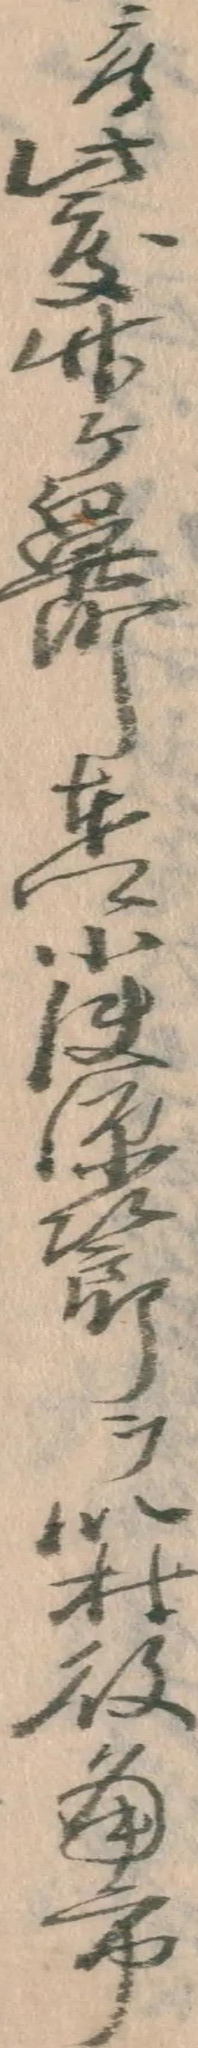ニ付此度竹ヶ鼻町東郷小使源次郎を以村役角市
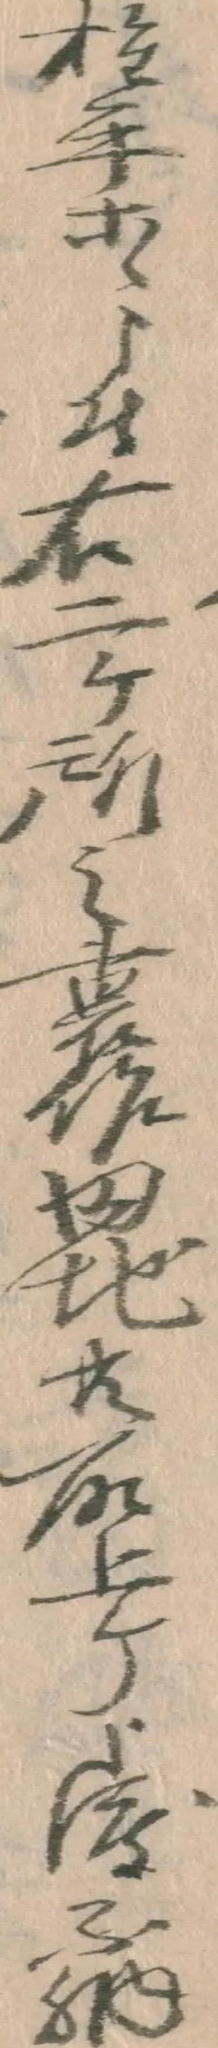権平等へ申付右二ケ所之裏作田地共取上ケ申渡不納
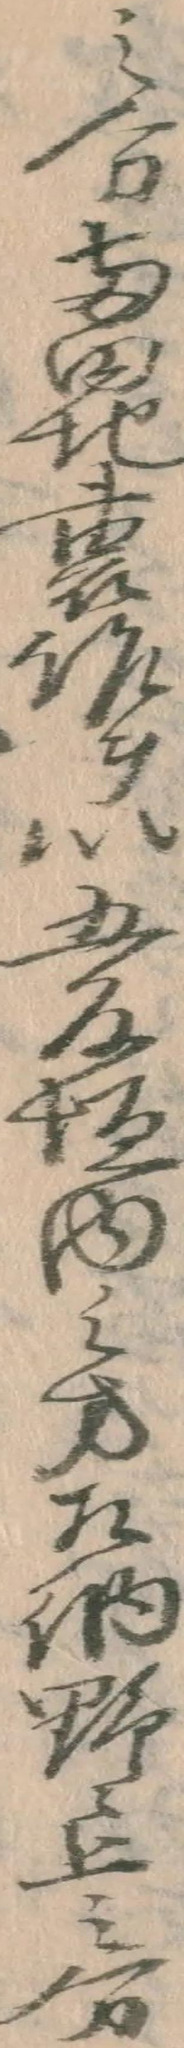之分両田地裏作ヲ以五反恒内之方相納野々上之分
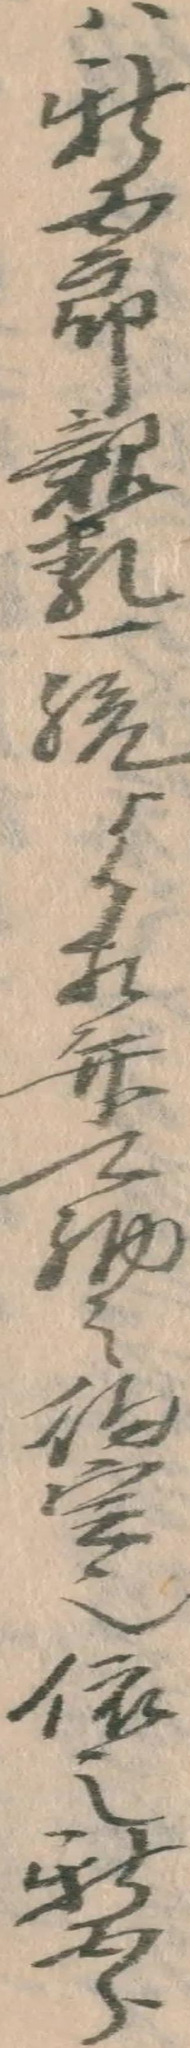は新五郎親類一統より相弁可納之約定也依之新五郎
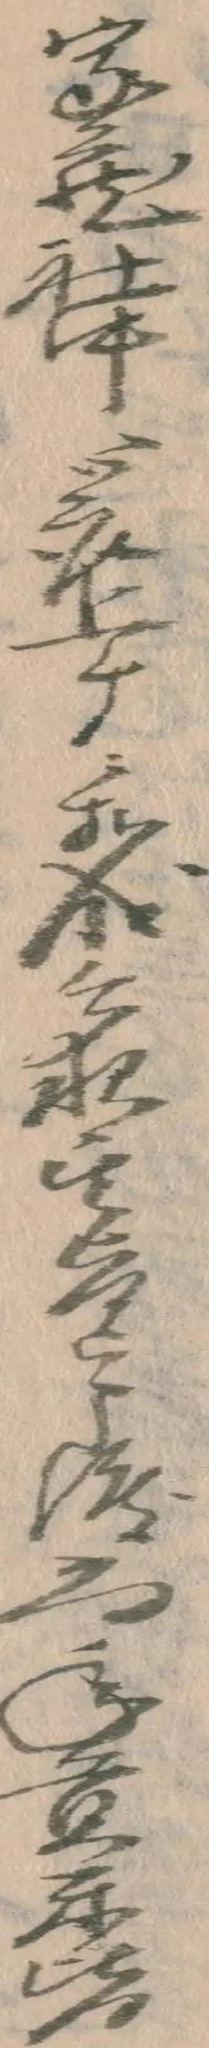家蔵社中へ御座上ヶニ相成今夜其旨被申渡尚年貢米皆
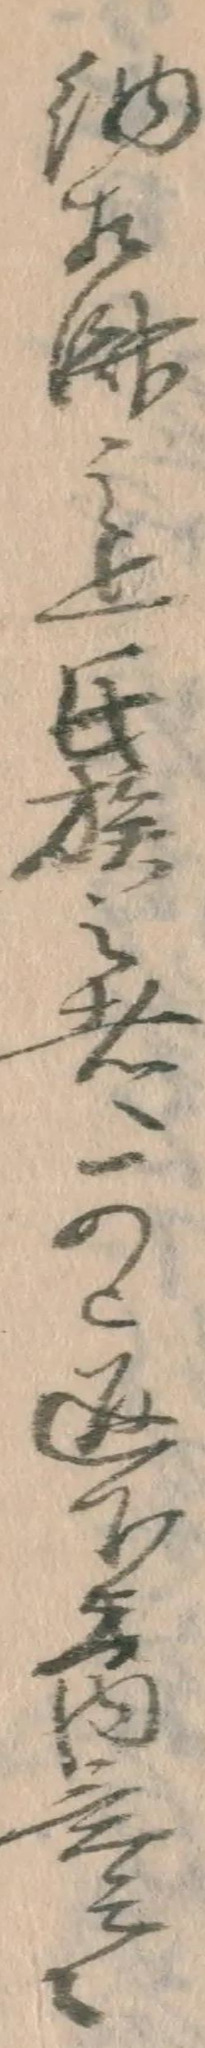納相済之上氏族之者へ可被返下候内意云々
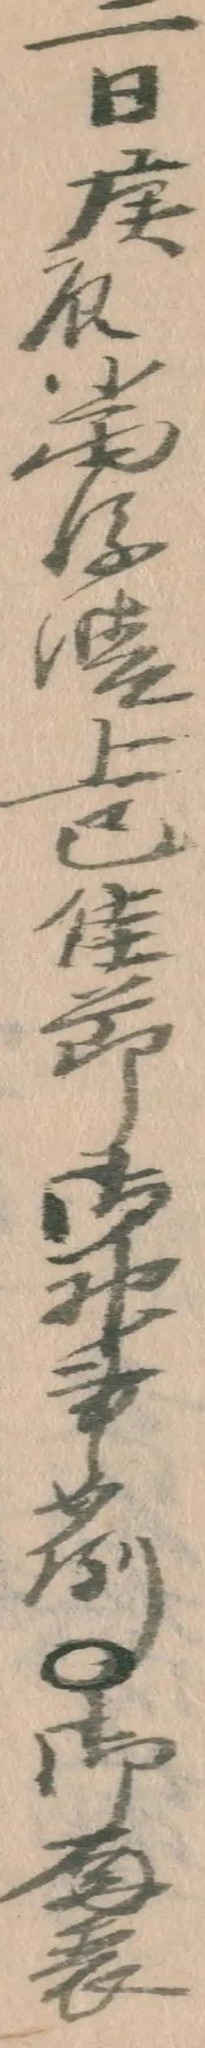三日庚辰小雨後晴上巳佳節御神事如例〇御雨表
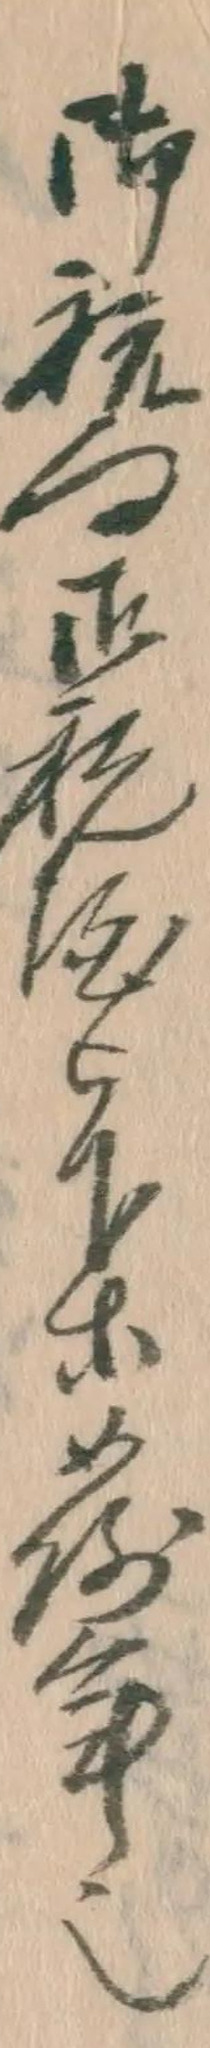御祝句御祝酒被下等如例年也
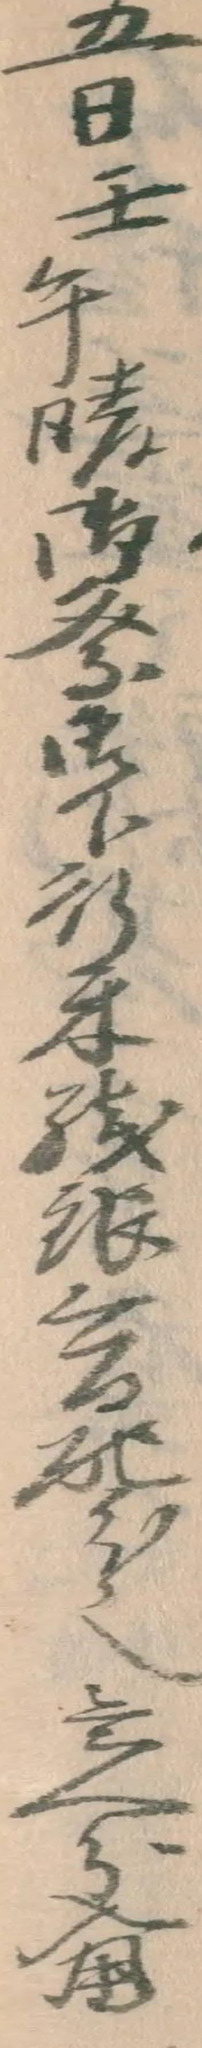五日壬午晴御祭御下行米残銀今日配分也壱人分入用
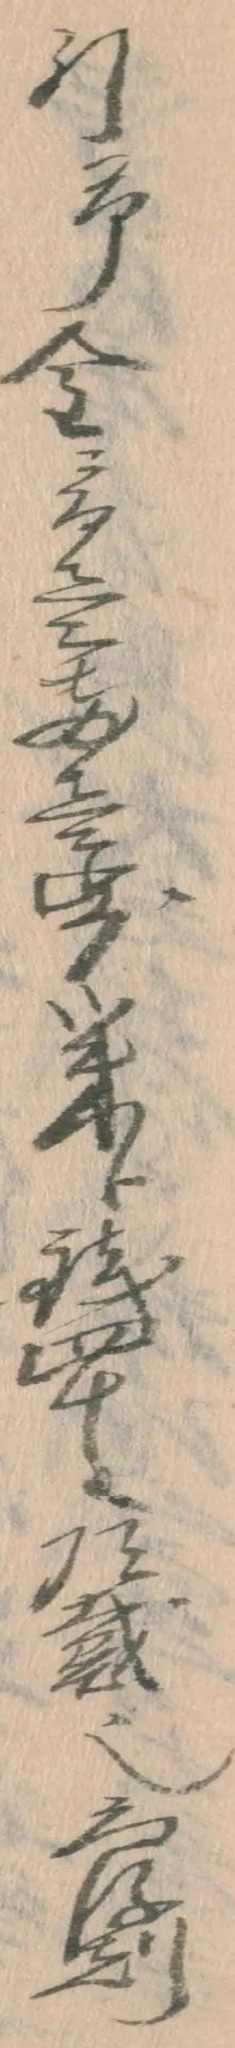引予金ニ而壱両壱歩弐朱ト残四十文頂戴也尚後割
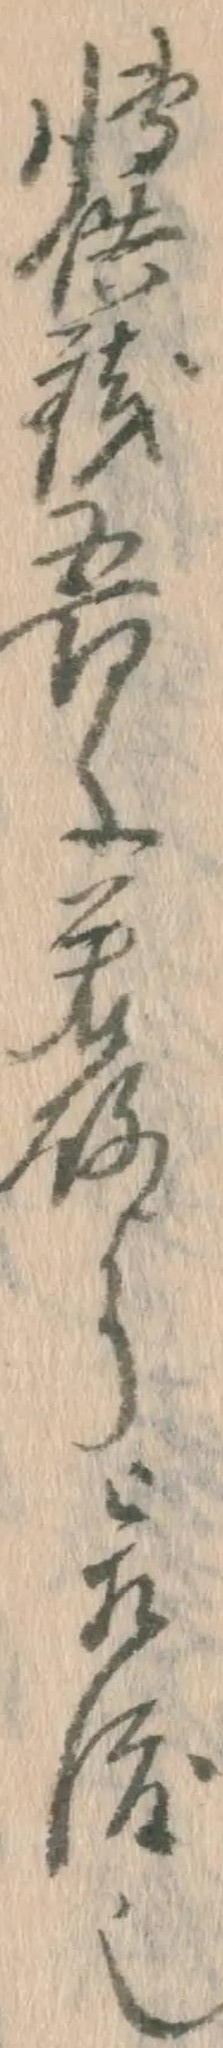轉供銭五百文若役より被相渡也
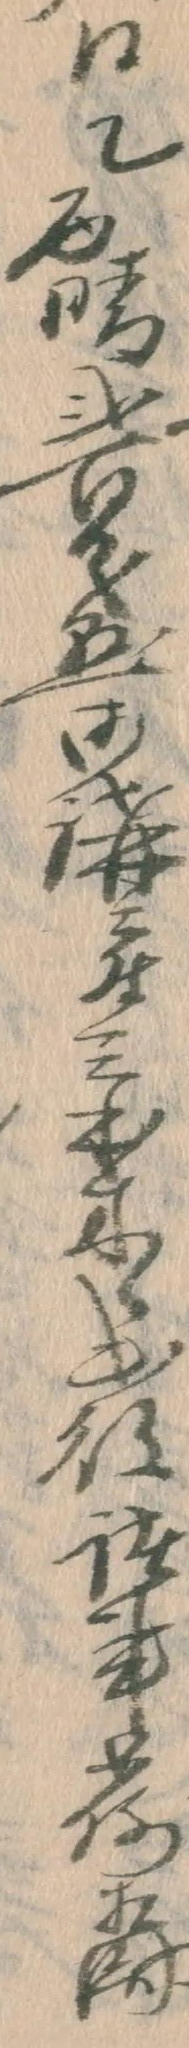八日乙酉晴弐百分懸御講二付三本木へ出役諸事如何相済
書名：賀茂社記録. 第67冊
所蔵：国立国会図書館 National Diet Library, JAPAN
